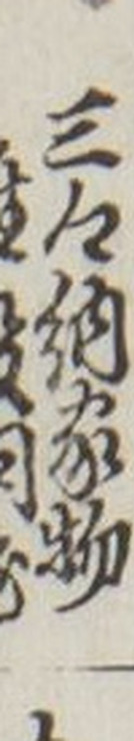三郷納家物
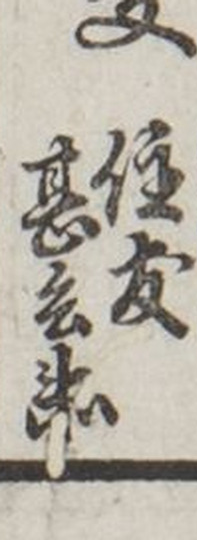甚兵衛
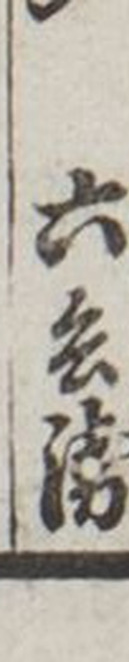分六兵衛
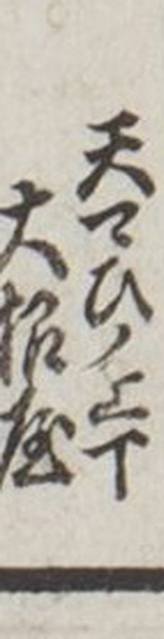天マひノ上町
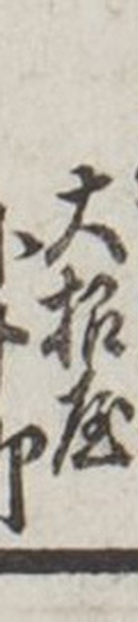大根屋
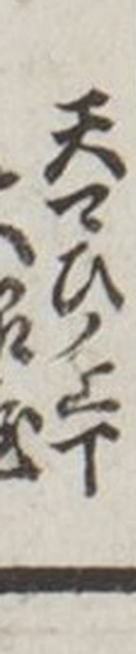天マひノ上町
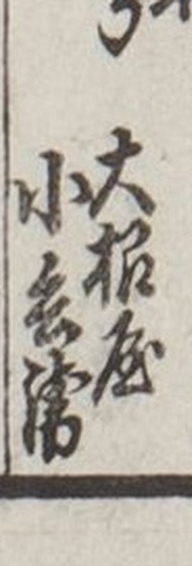大根屋
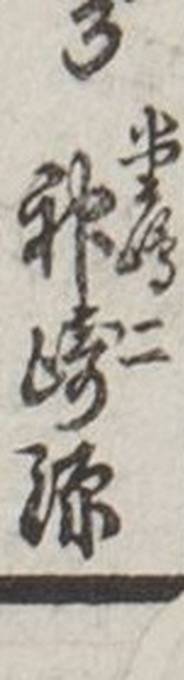神崎源
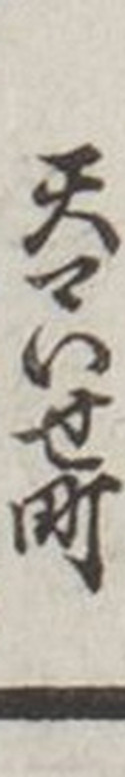天マいせ町
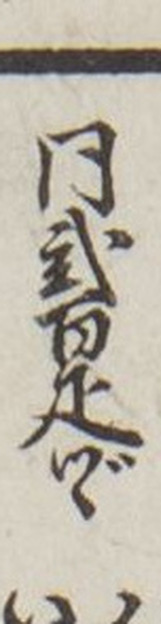同弐百疋ヅヽ近松
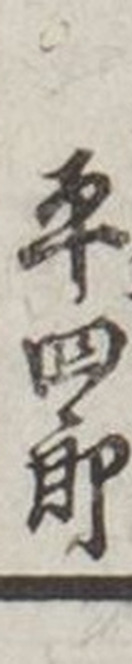平四郎
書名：米高直ニ付大阪市中にほどこし名前録後編
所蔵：あいおいニッセイ同和損保株式会社
